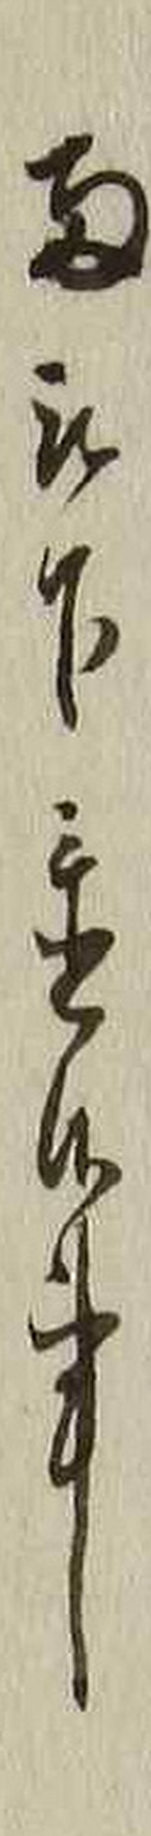両被下置候事
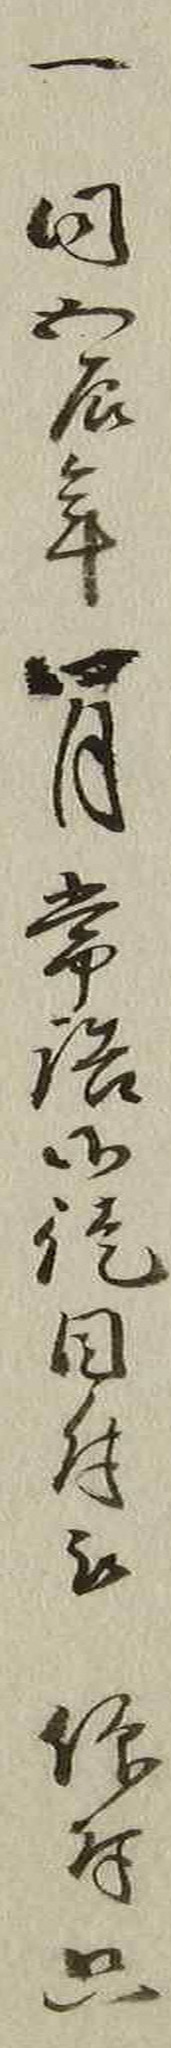一同五辰年四月常詰御徒目付被仰付只
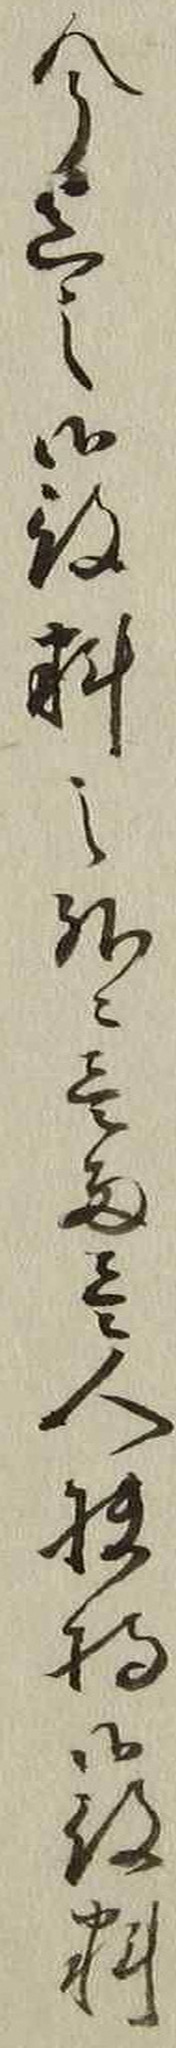今迄之御役料之外ニ壱両壱人扶持御役料
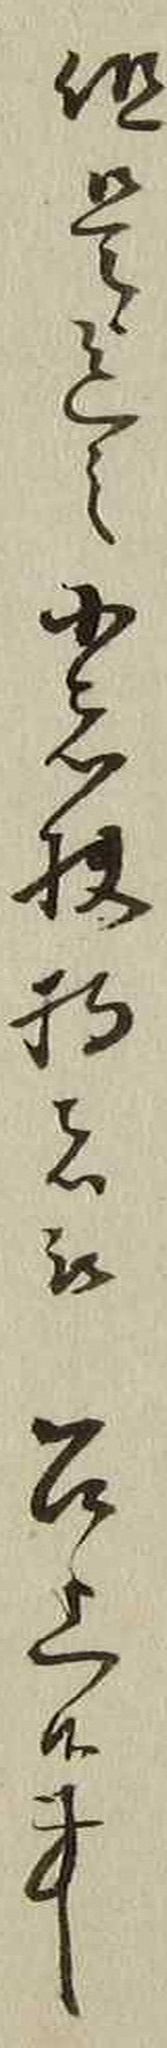但是迄之小者扶持者被召上候事
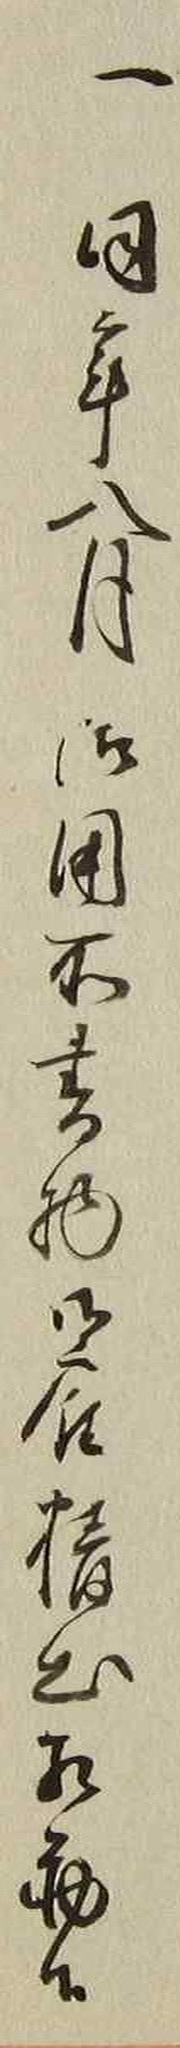一同年八月御用所青物御雇精出相勤候
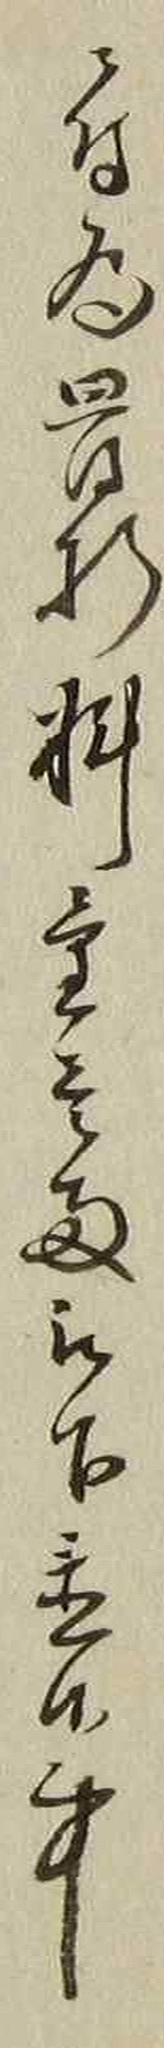ニ付為骨折料金壱両被下置候事
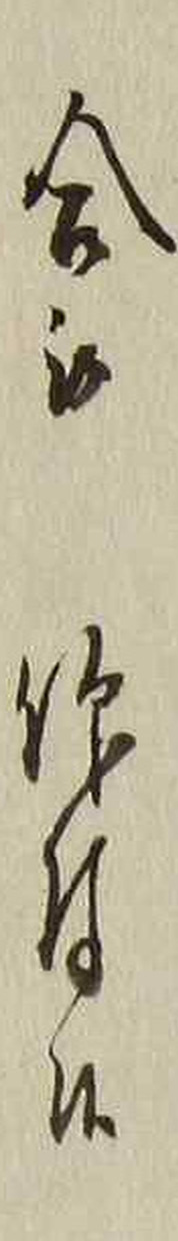合被仰付候
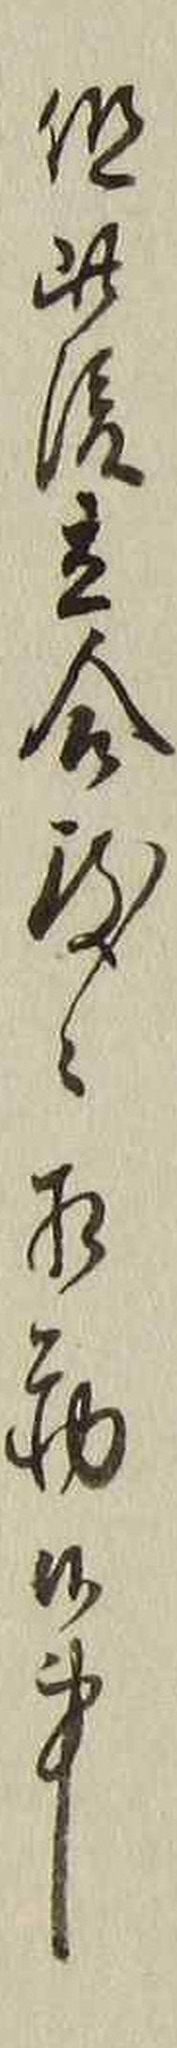但此後立合度々相勤候事
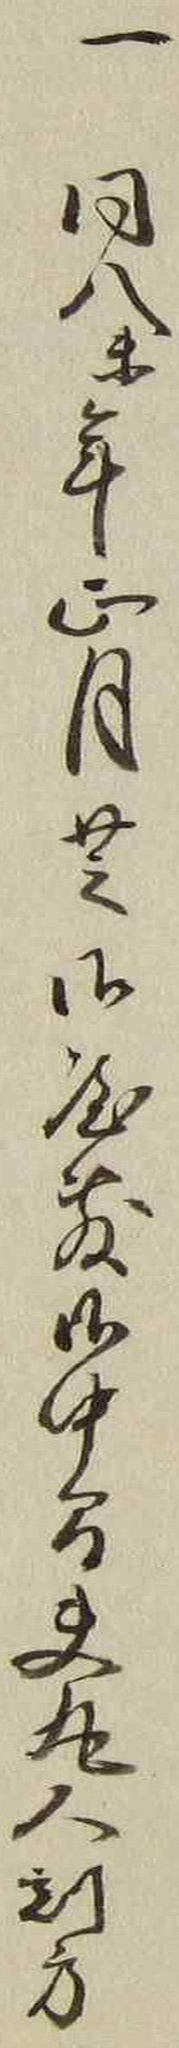一同八未年正月芝御屋敷御中間夫丸人割方
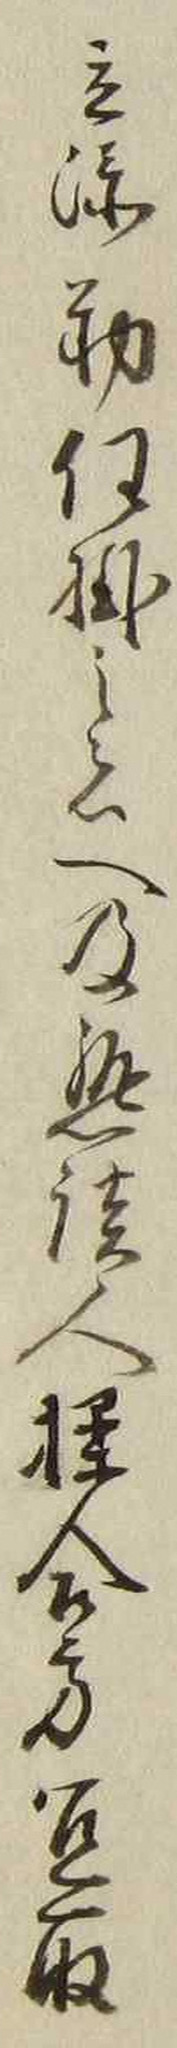立添勤任掛之者へ及熟談人操合方宜取
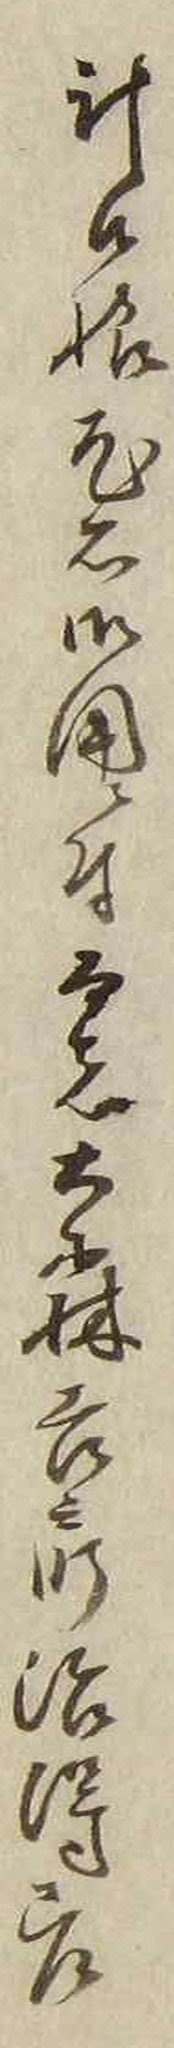計候様尤右御用ニ付而者大森吉郎治得差

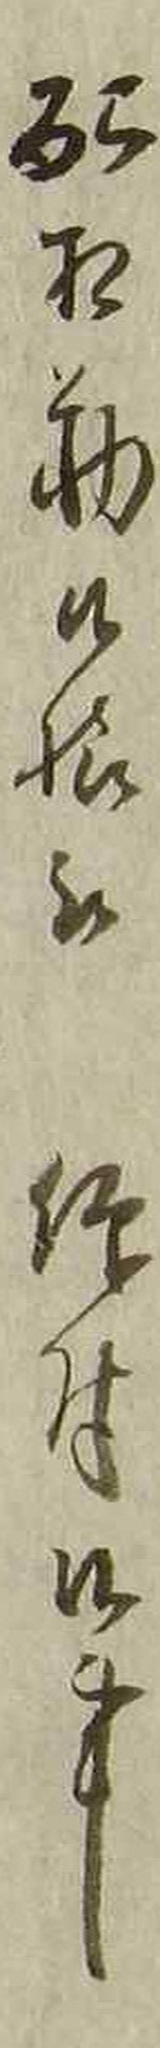配相勤候様被仰付候事
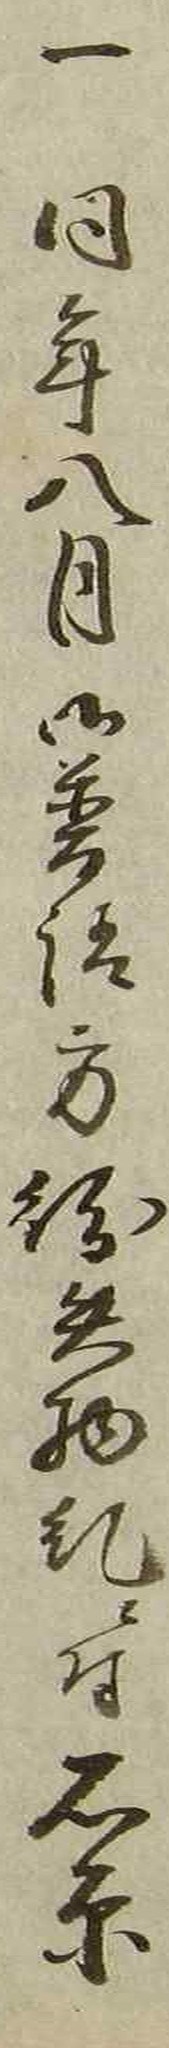一同年八月御普請方紛失物糺ニ付石原
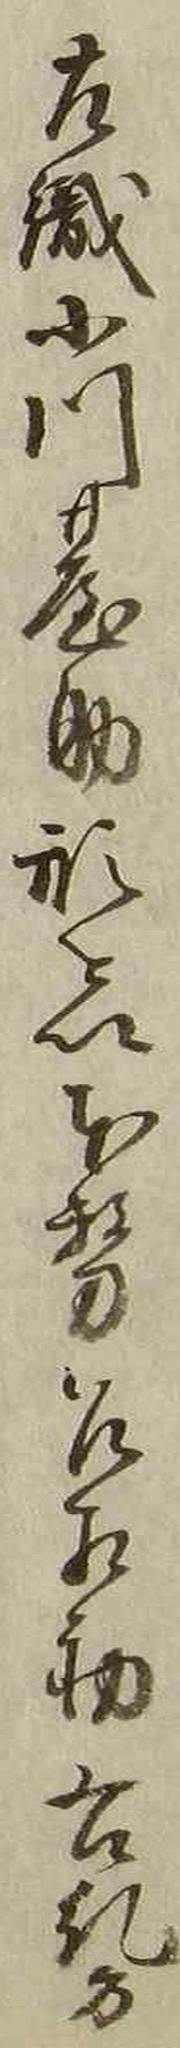左織小川台助形を以本務乍相勤右糺方
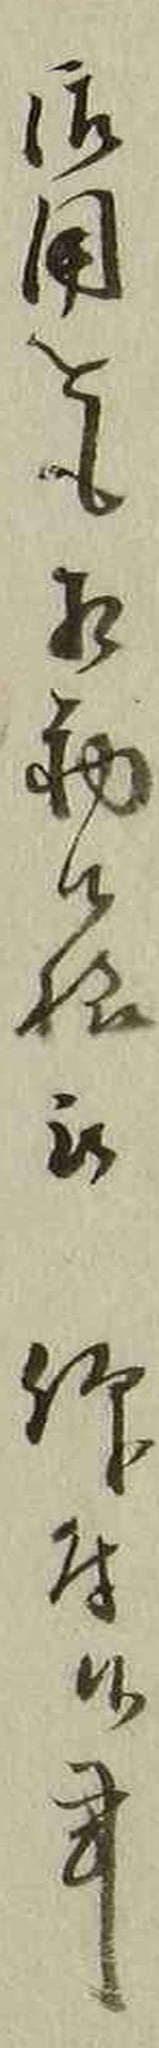御用をも相勤候様被仰付候事
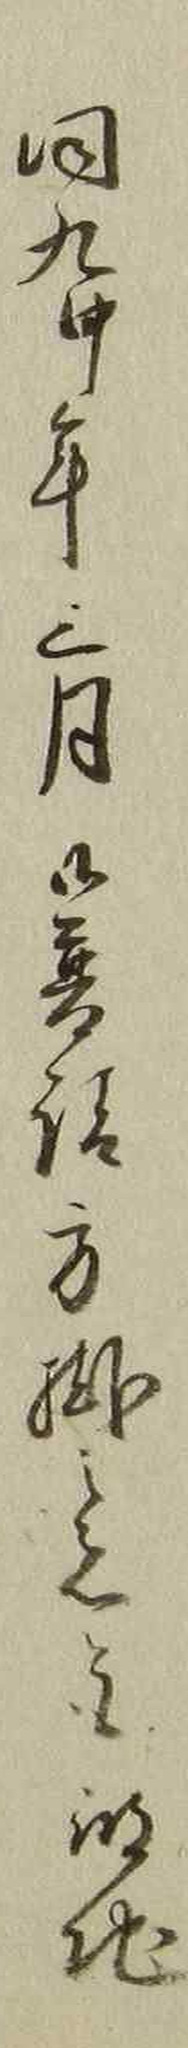一同九申年三月御普請方掛之者とも彼地
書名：諸士系譜　巻之132　た之部8
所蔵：会津若松市立会津図書館
